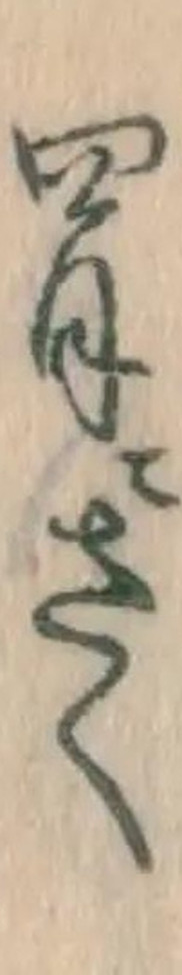四月にさく
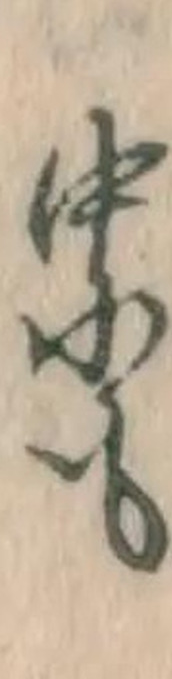中にも
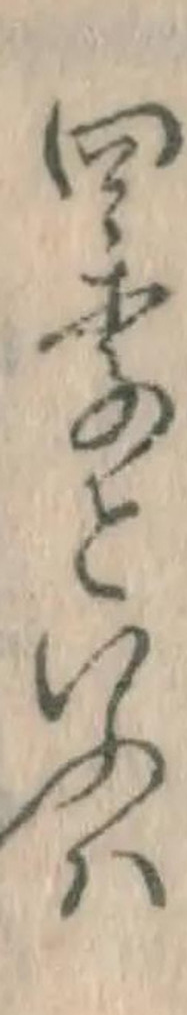四季といふは
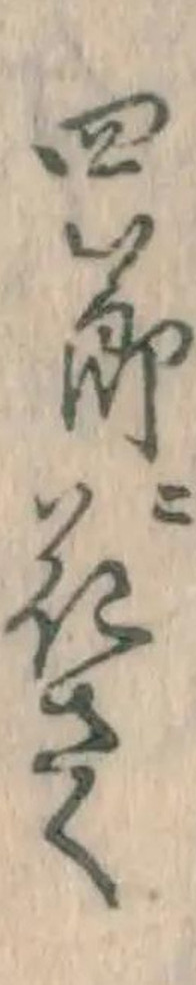四節に花さく
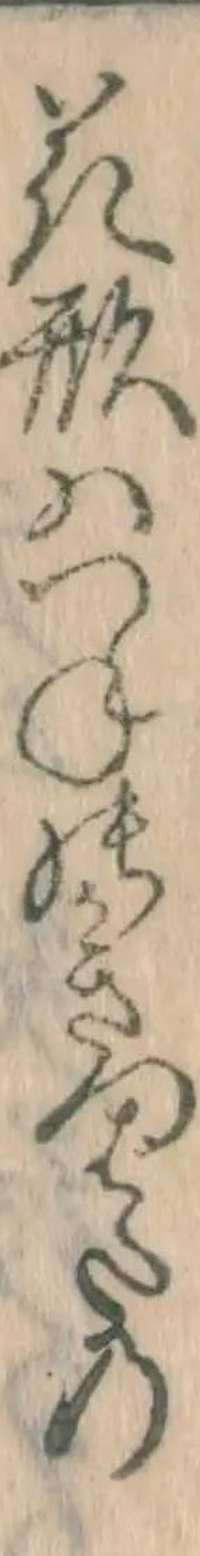花形はつねのさきつばたの
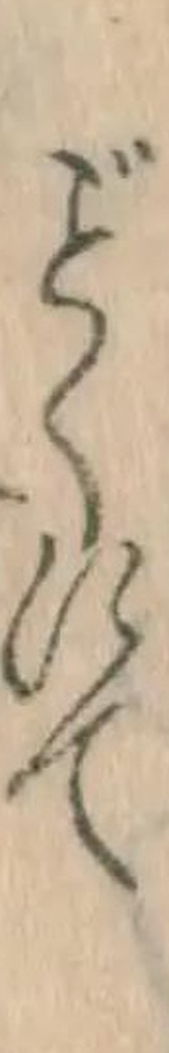ごとくにて
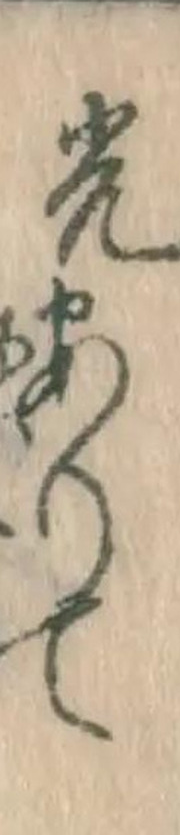光ありて
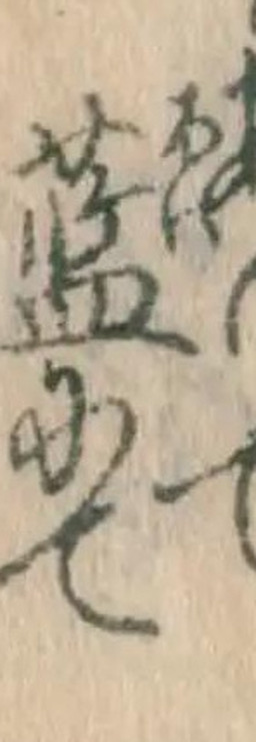藍にて
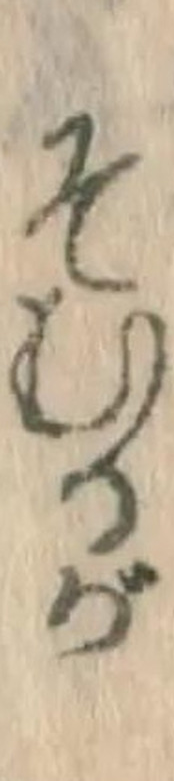そむるが
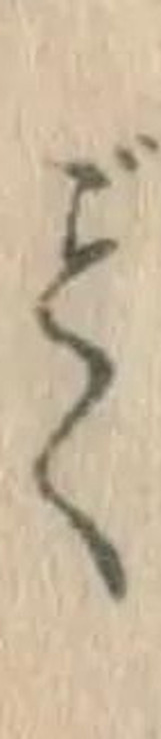ごとく
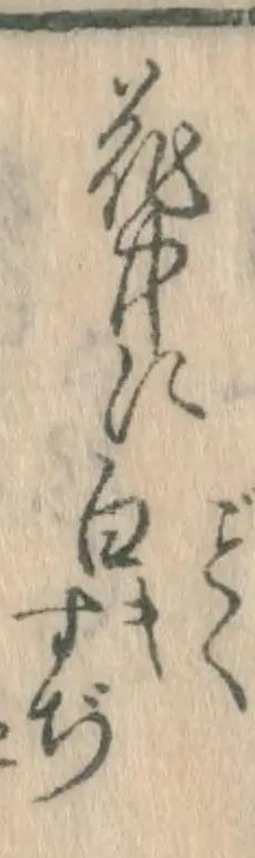花中に白きすぢ有
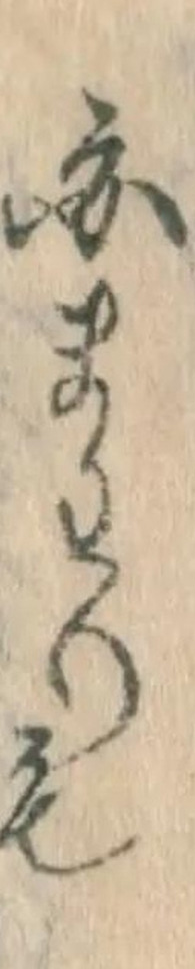亦まわりも
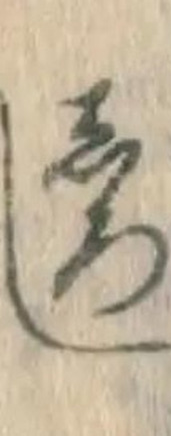しろし
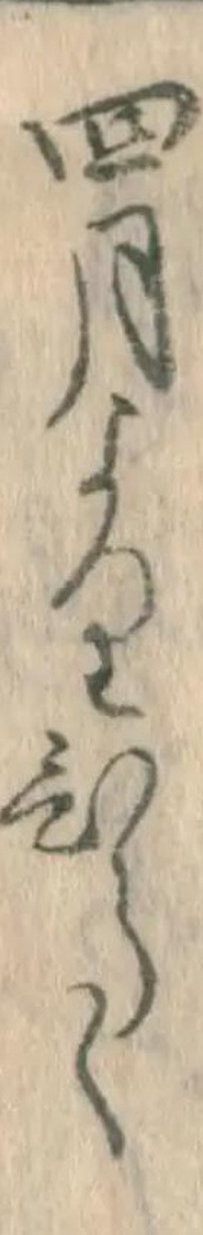四月よりひらく
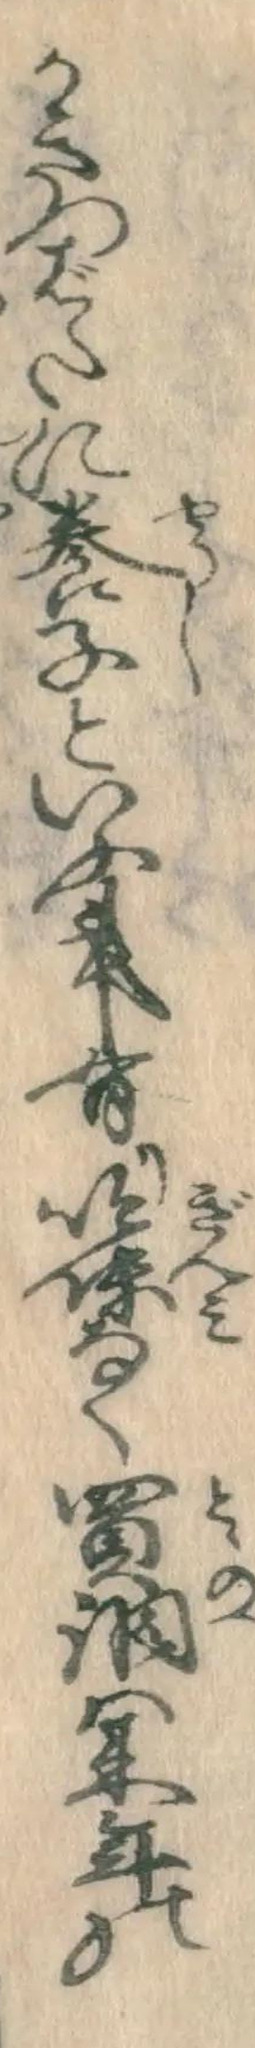かきつばたに養子といふ事有り吟味なく買調は来年の
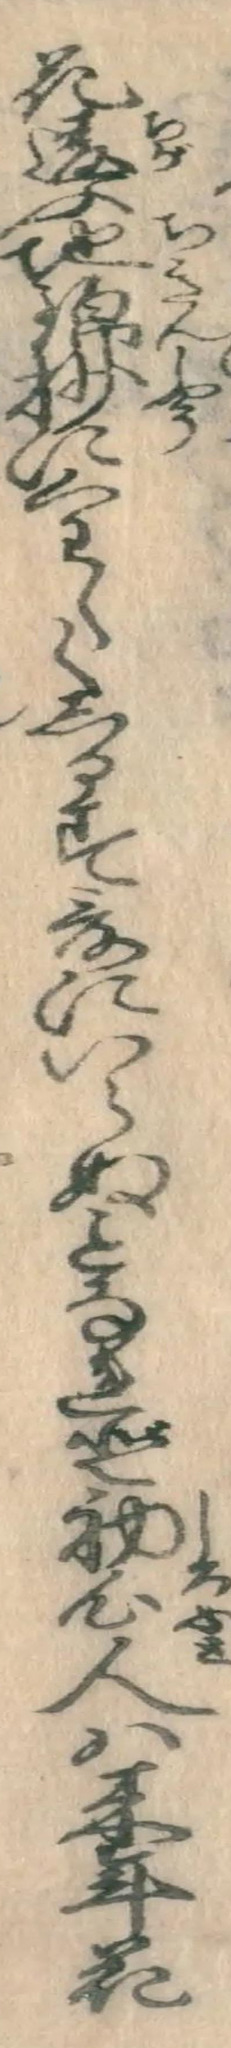花違ふ地錦抄にくわしくしるす爰にいらぬことなれど初心は来年花
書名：艸花繪前集. [1]
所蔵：国立国会図書館 National Diet Library, JAPAN
